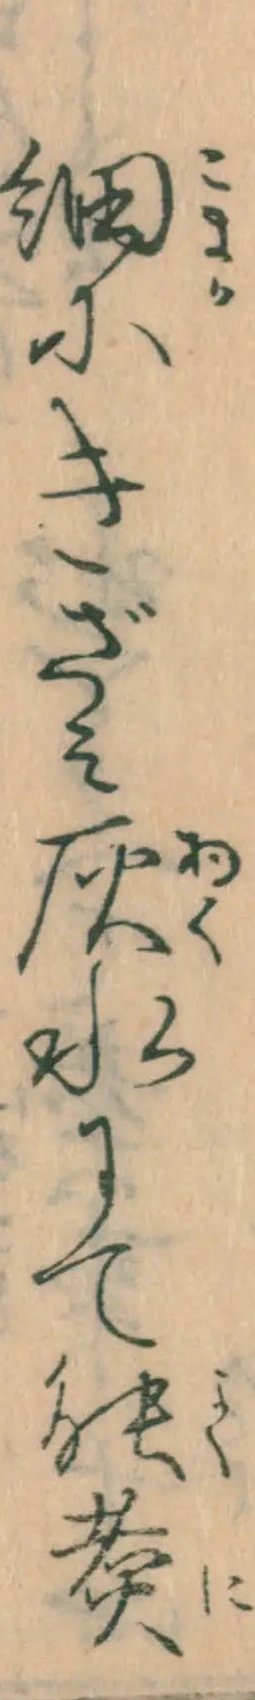わらび細にきざみ灰水にて能煮
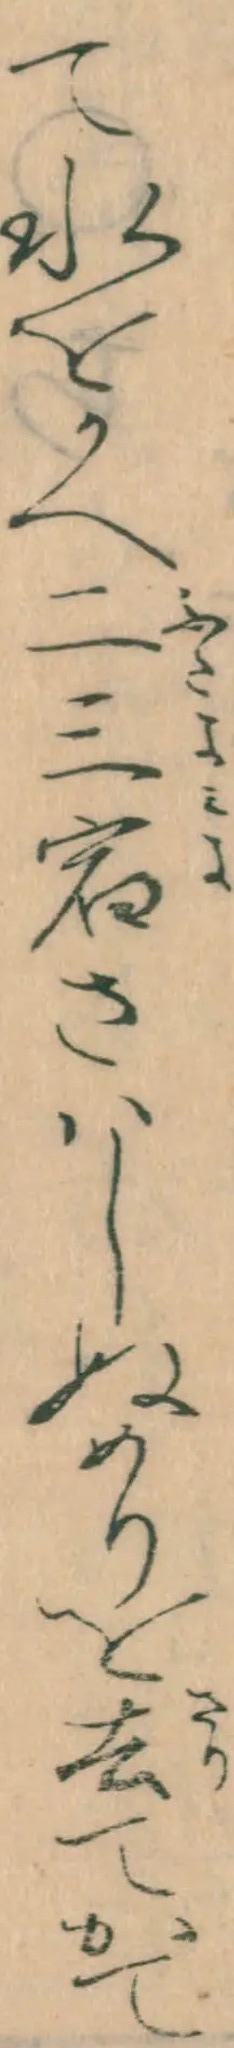て水をかへ二三宿さはしぬめりを去てかて
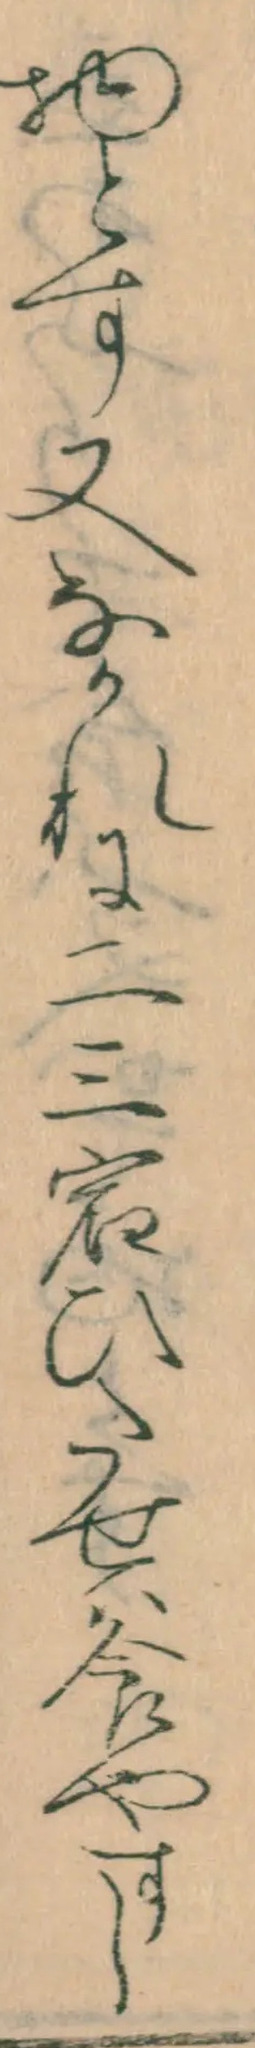物とす又なかれに二三宿ひたせは食やすし
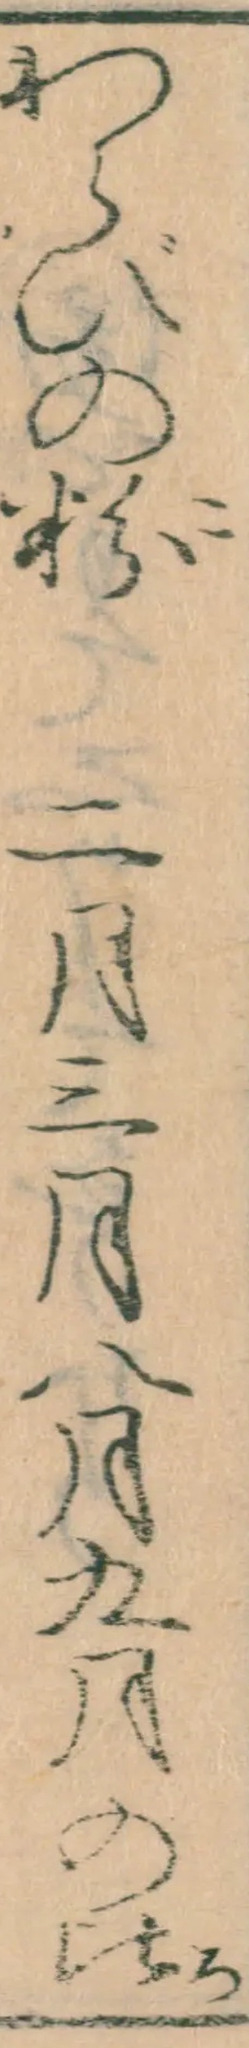わらびの粉二月三月八月九月の比
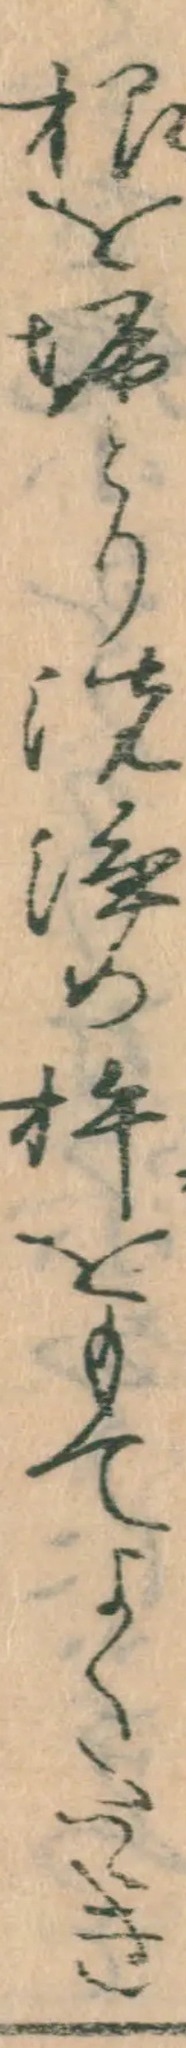根を堀とり洗浄め杵をもてよくたゝき
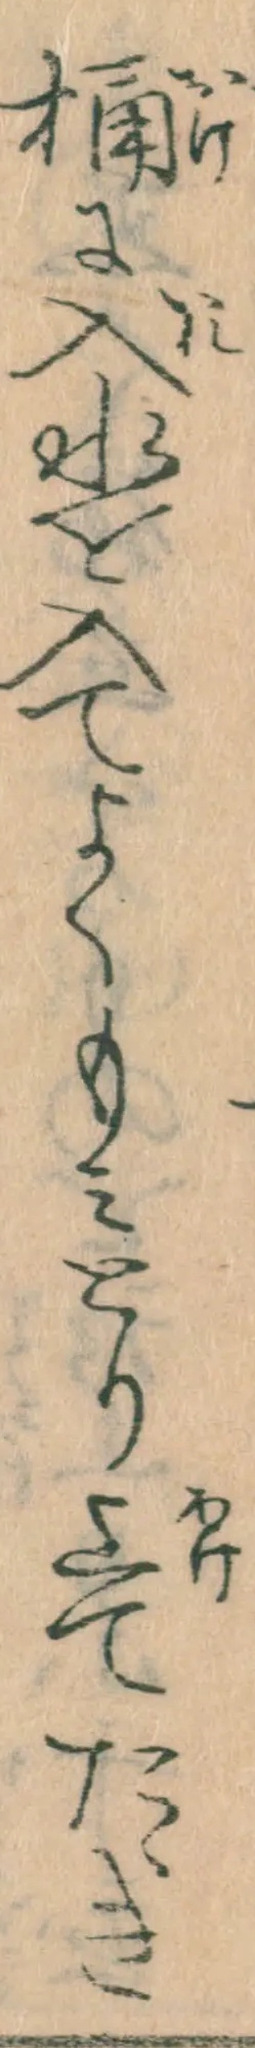桶に入水を入てよくもみとり上てたゝき
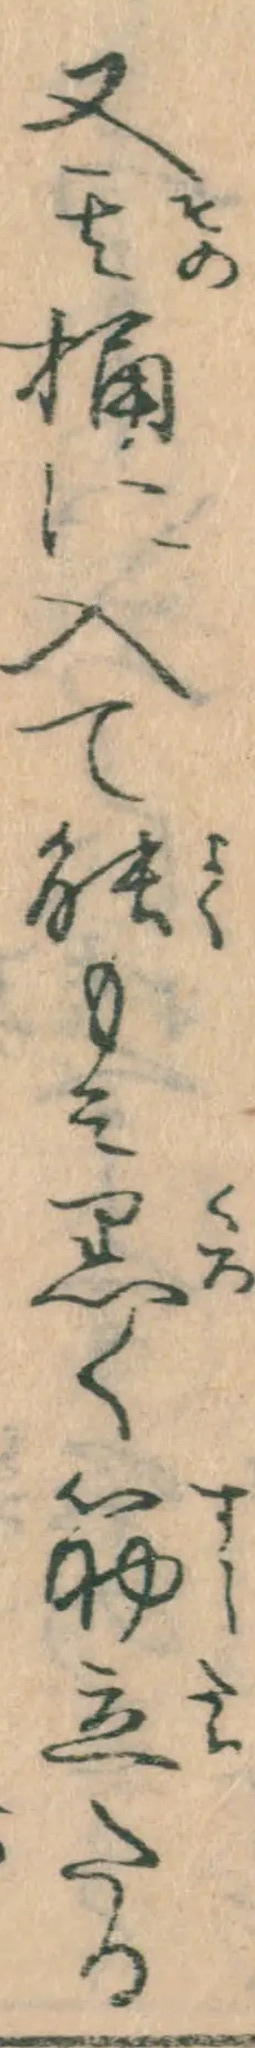又其桶に入て能もみ黒く筋立たる
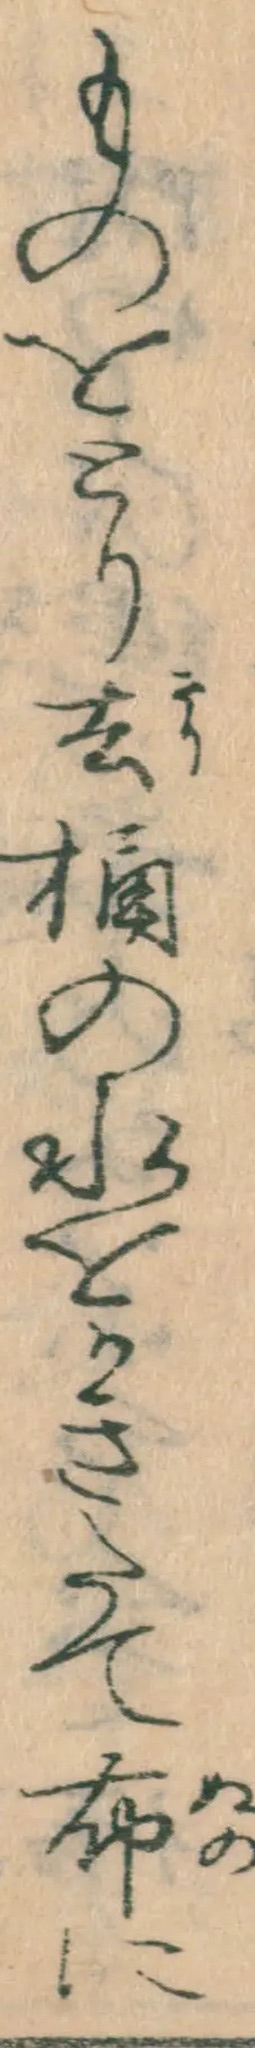ものをとり去桶の水をかきたて布に
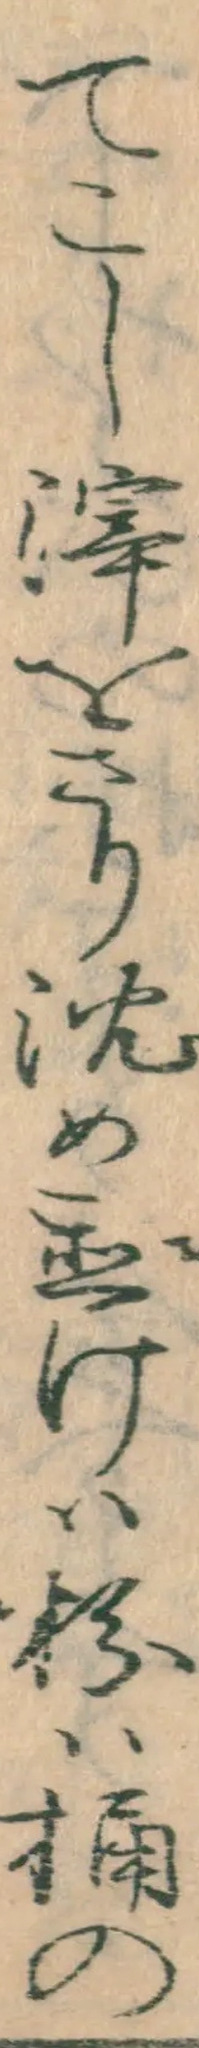てこし滓をさり沈め置けは粉は桶の
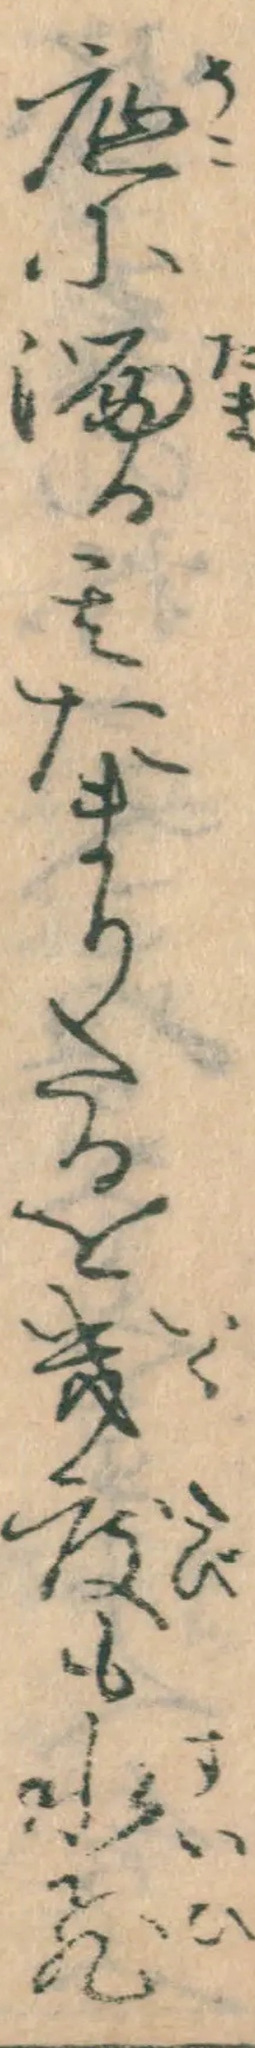底に溜る其たまりたるを幾度も水飛
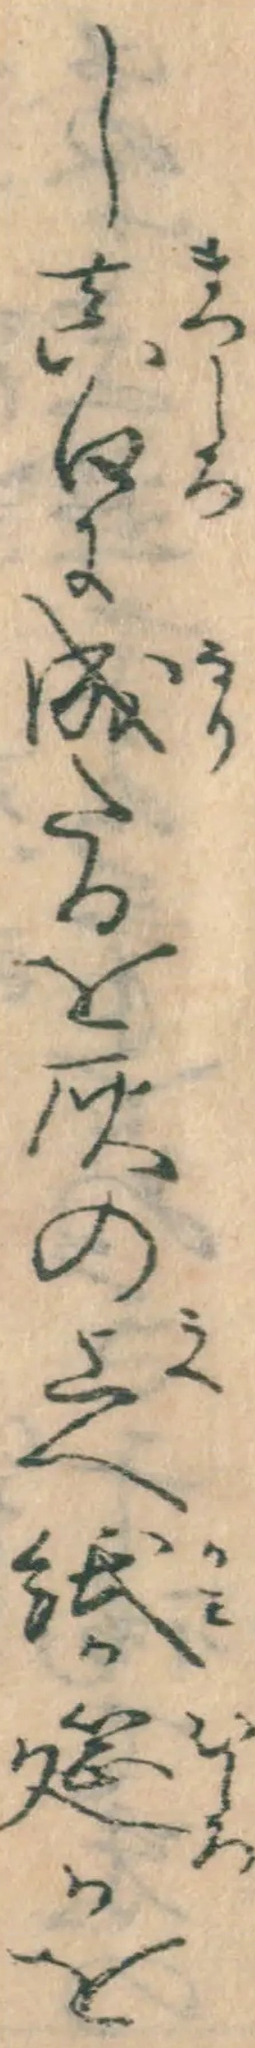し真白に成たるを灰の上へ紙か筵かを

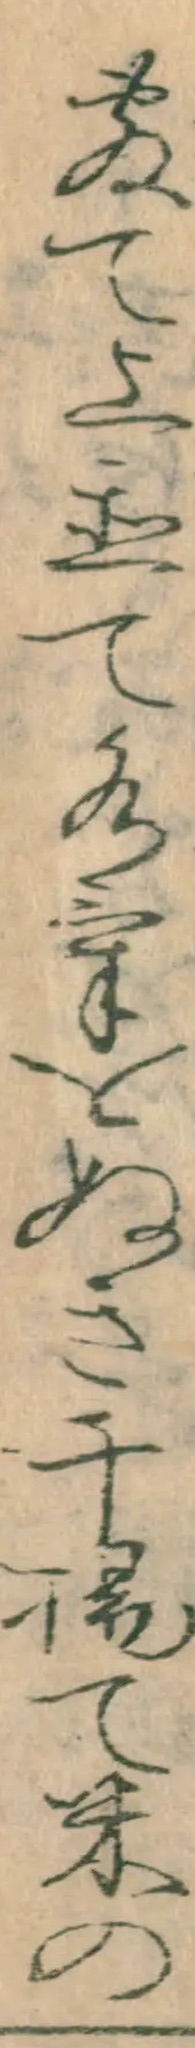敷て上置て水気をぬき干揚て米の
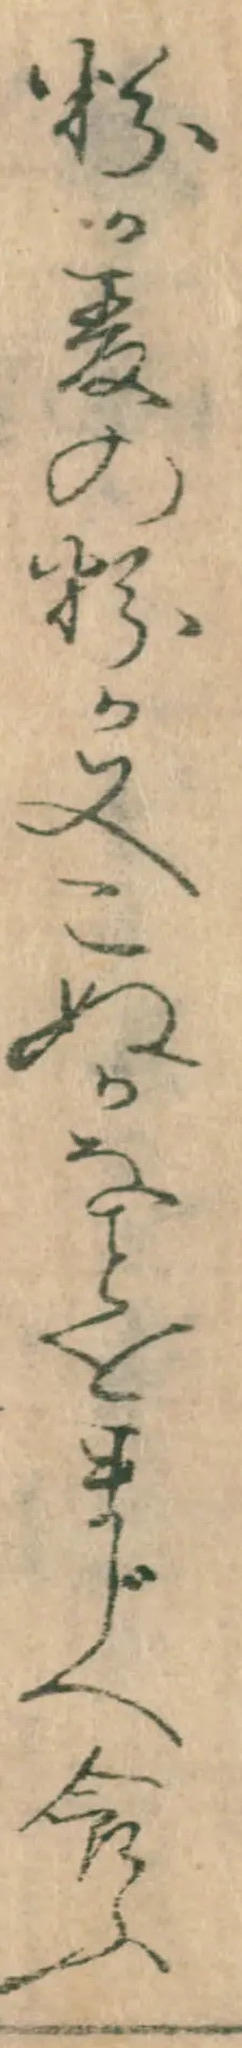粉か麦の粉か又こぬかなとをまじへ食ふ
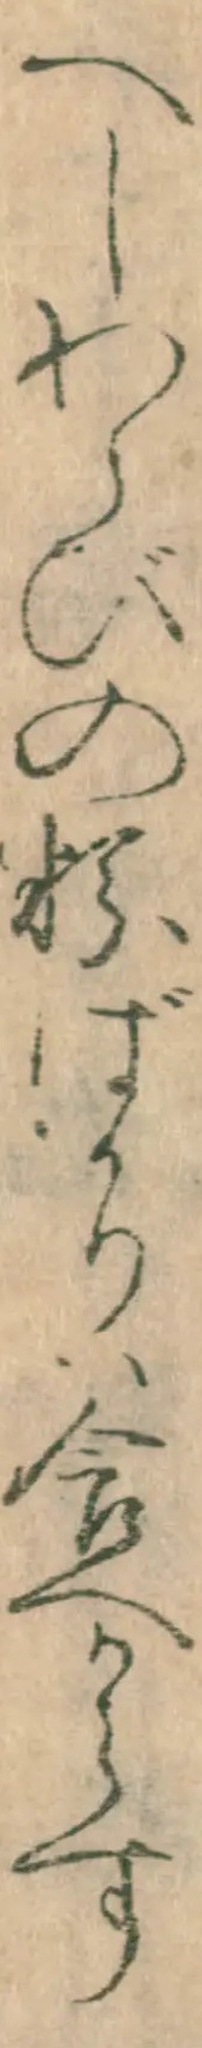へしわらびの粉ばかりは食へからす
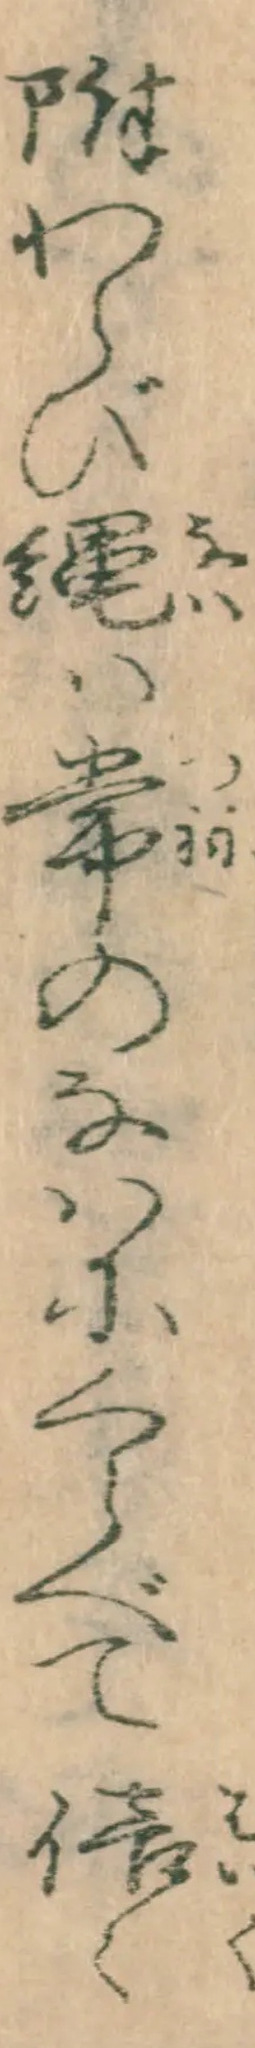附わらび縄は常のなはにくらべて倍々
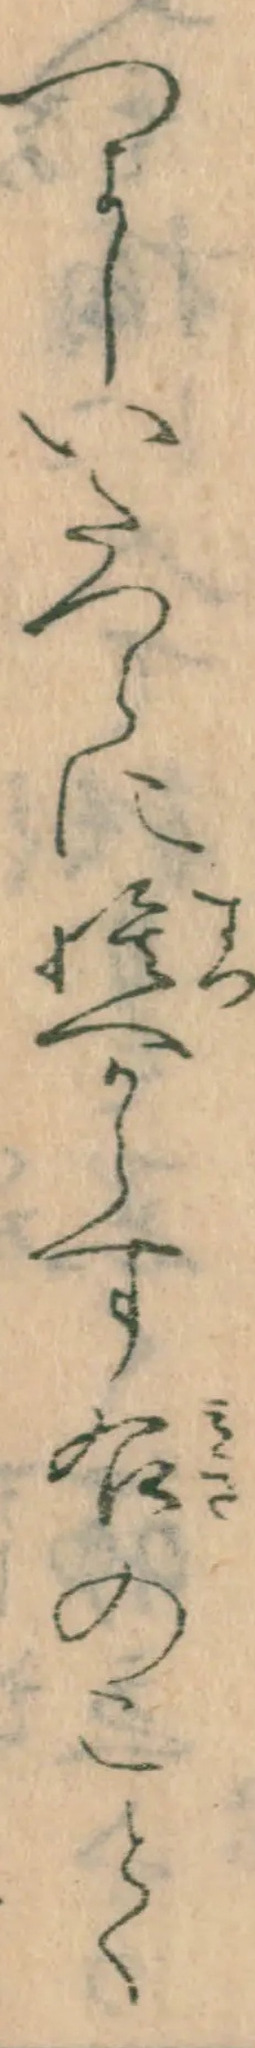つよしいたつらに捨へからす右のことく
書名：かてもの
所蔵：国立国会図書館 National Diet Library, JAPAN
